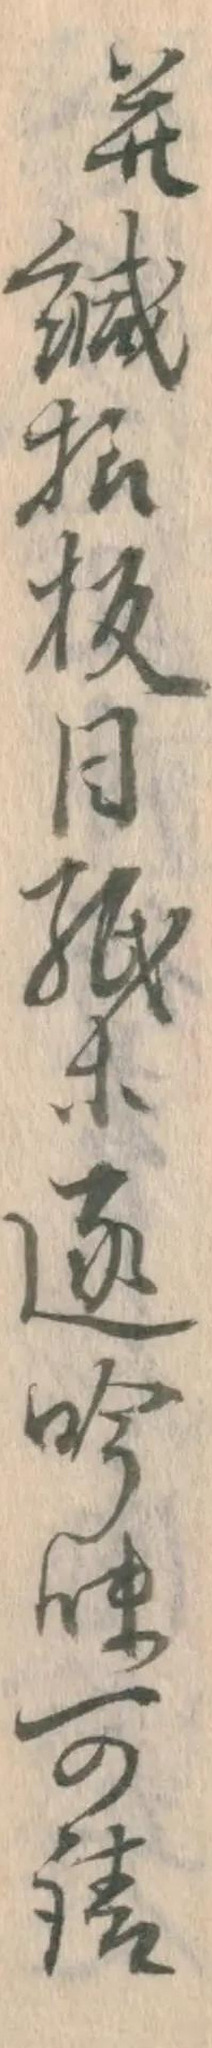并鍼様板目紙等逐吟味可請
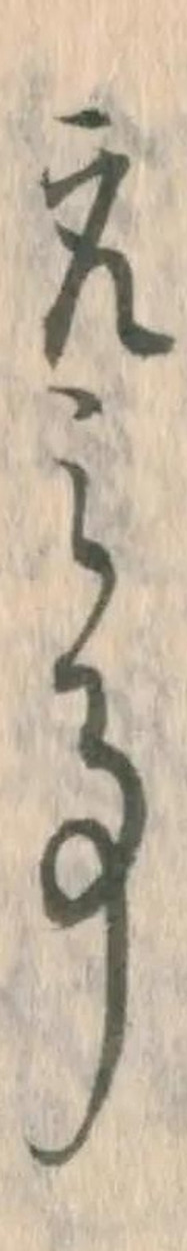取之事
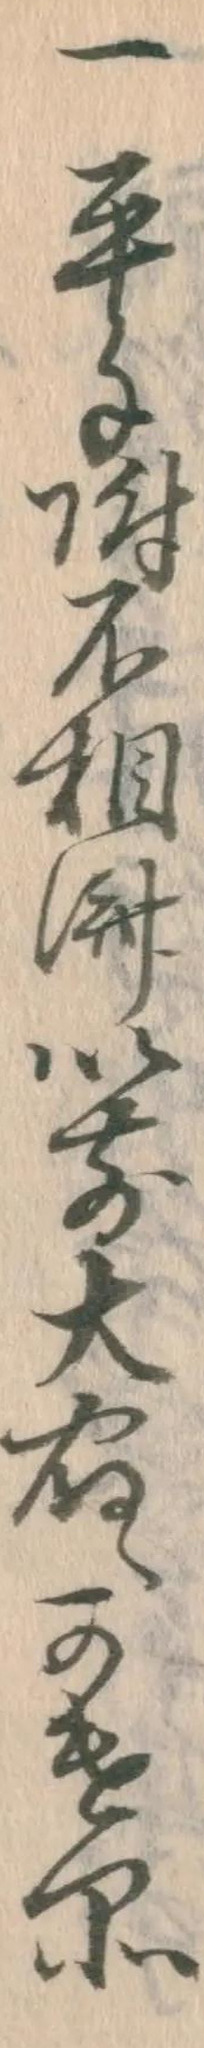一平手附不相済以前大宿へ可遣品
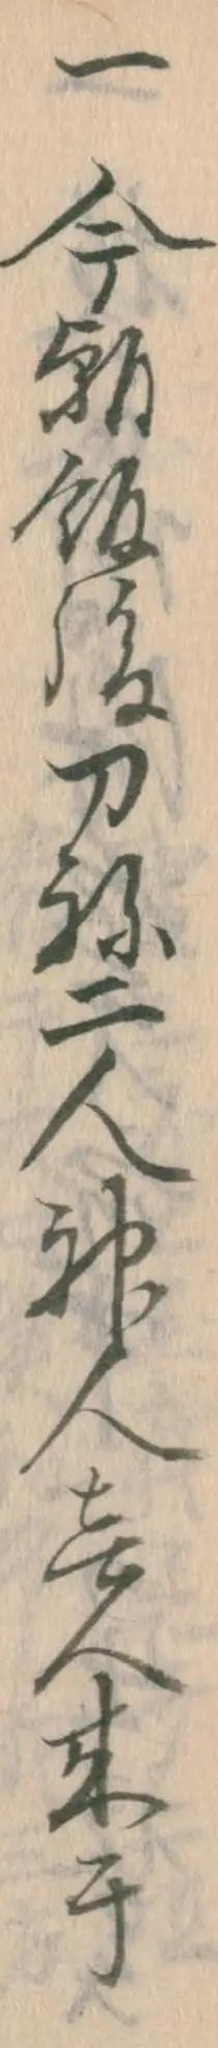一今朝飯後刀祢二人神人壱人来于
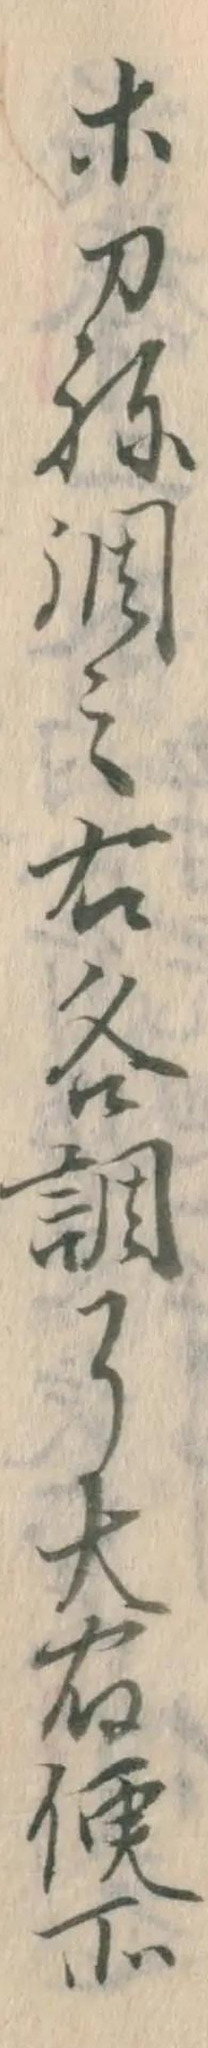等刀祢調之右各調了大宿便所
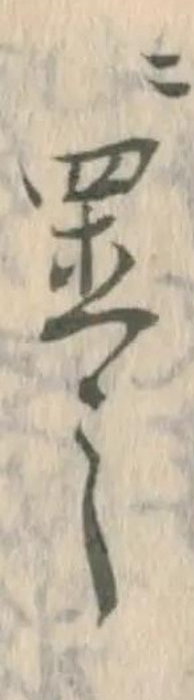に置之

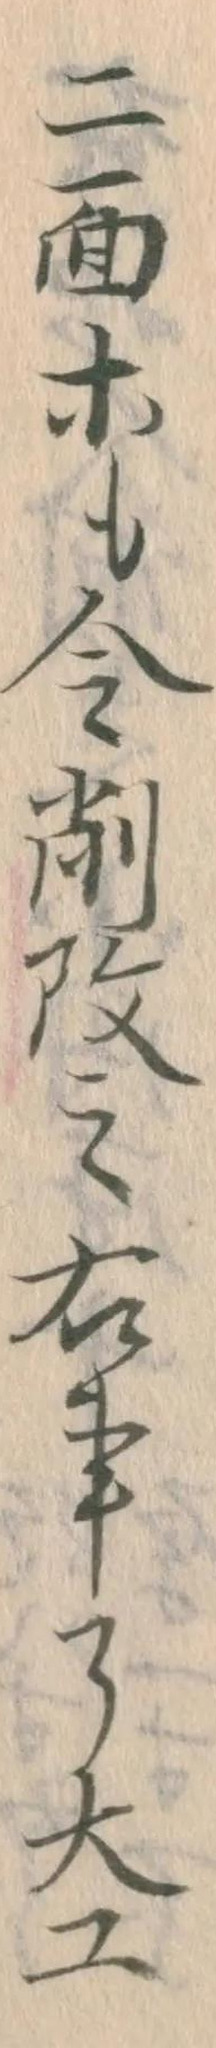二面等も令削改之右事了大工
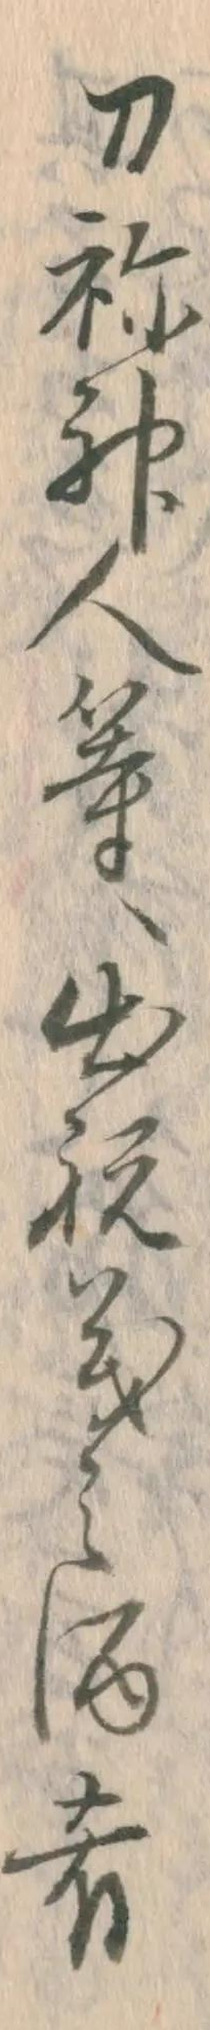刀祢神人等へ出祝義之酒肴
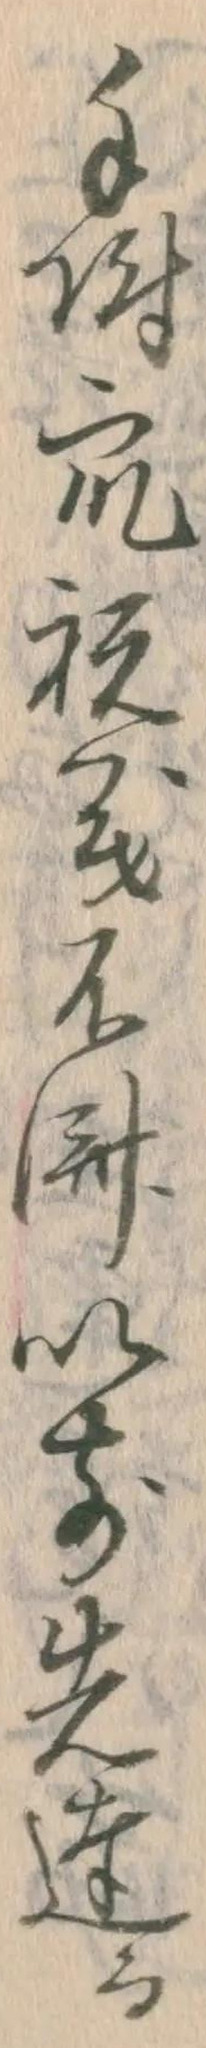手附衆祝義不済以前先達而
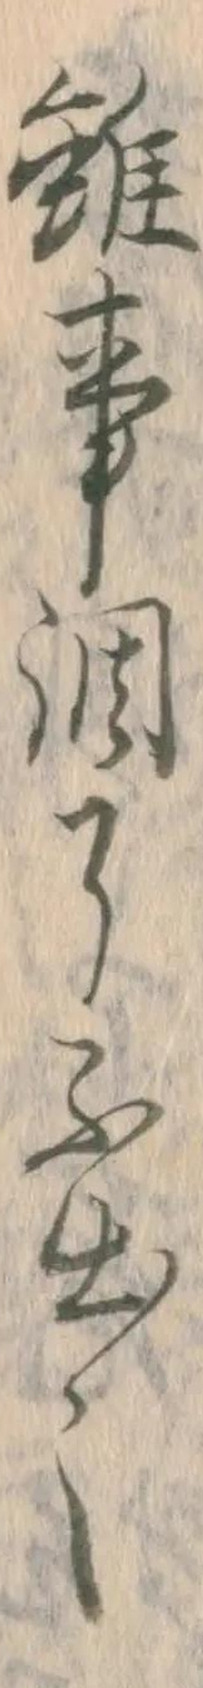雖事調了不出之
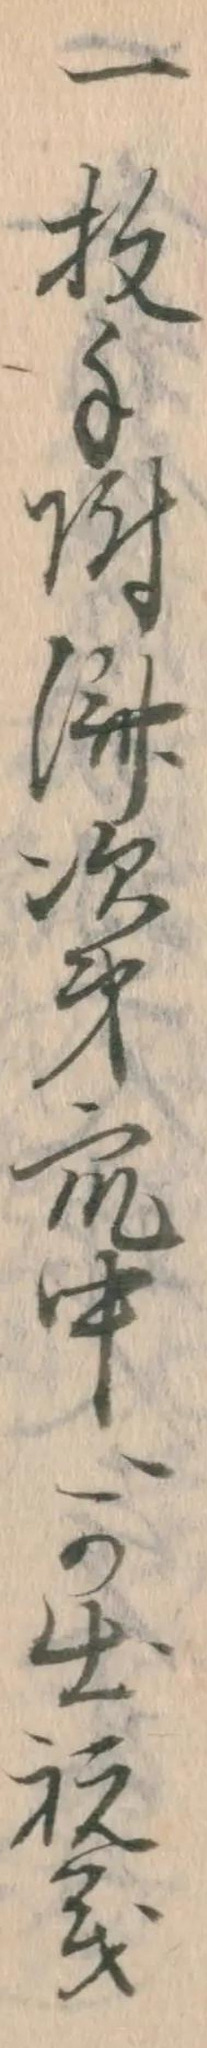一枚手附済次第衆中へ可出祝義
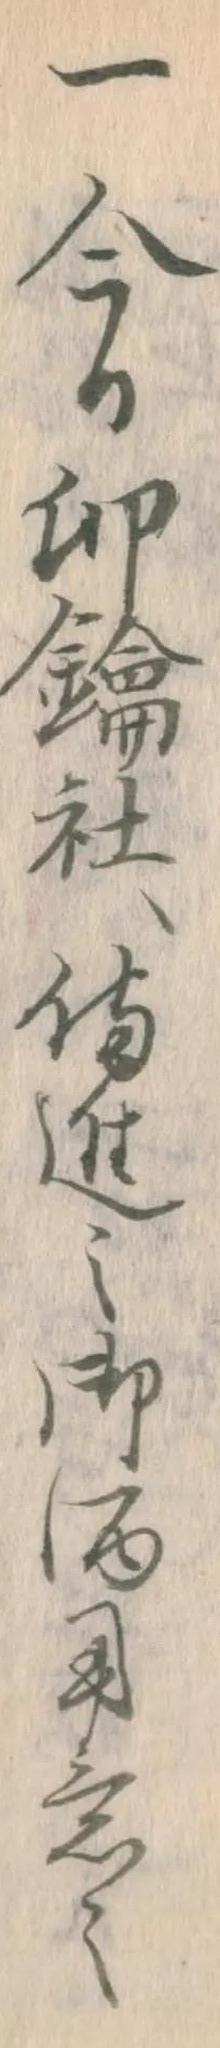一今日卯鑰社へ備進之御酒用意之
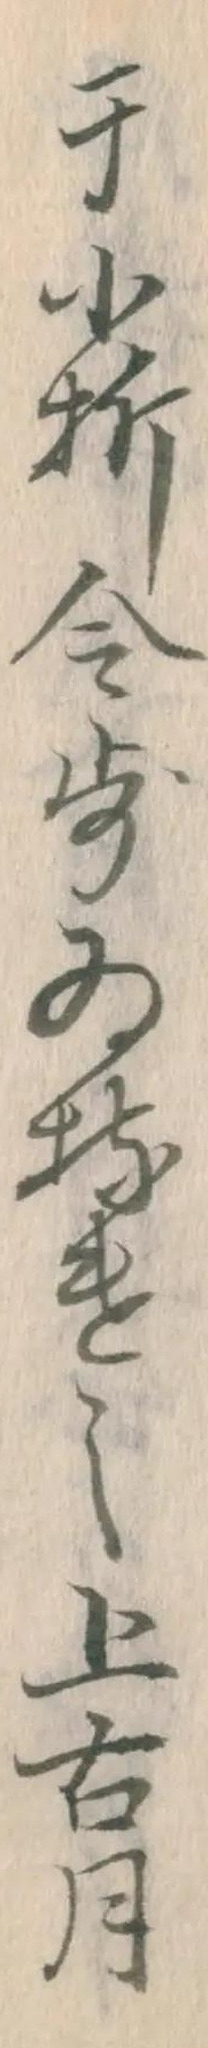干小折令歩為持遣之上古月
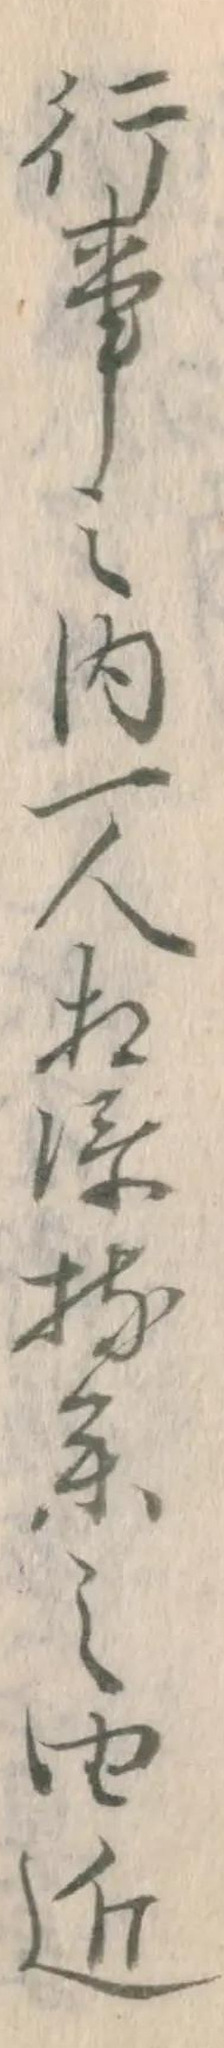行事之内一人相添持参之由近
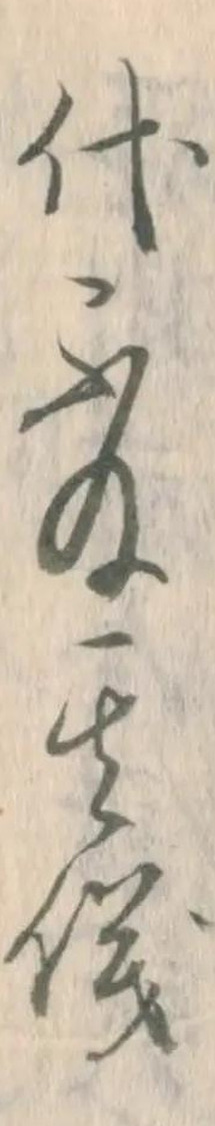代不及其儀
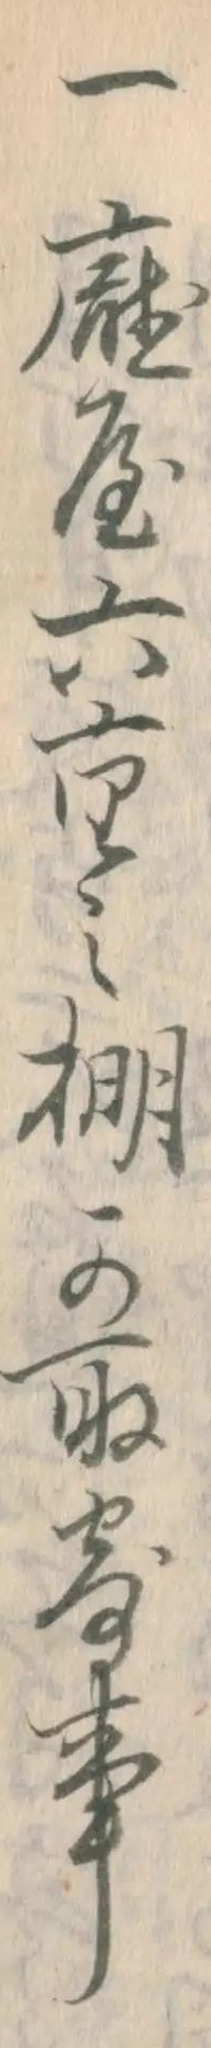一庁屋六重之棚可取寄事
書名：賀茂社記録. 第81冊
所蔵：国立国会図書館 National Diet Library, JAPAN
